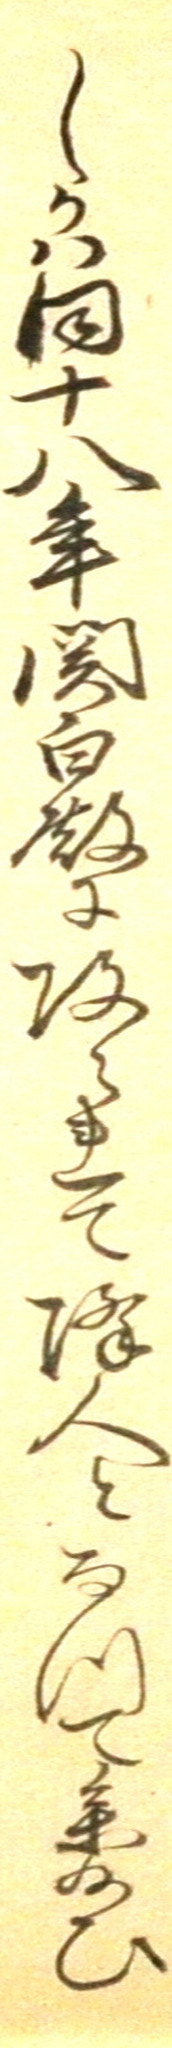しかは同十八年関白殿に攻られて降人となつて参給ひ
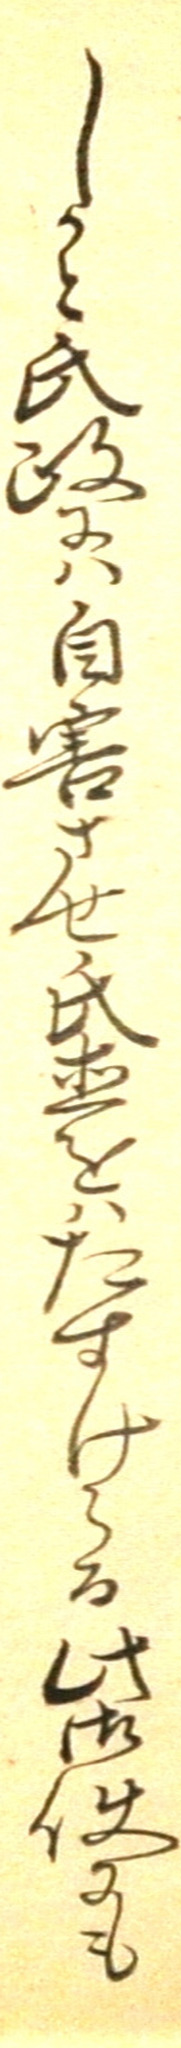しかと氏政には自害させ氏直をはたすけらる此御使にも
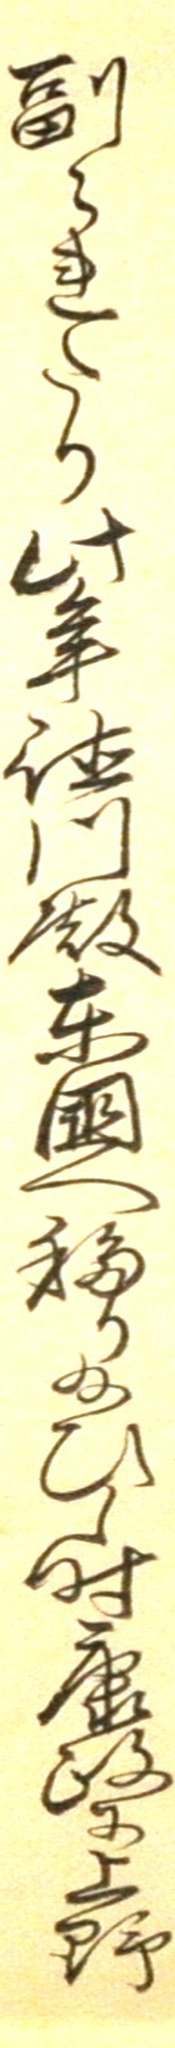副られたり此年徳川殿東国へ移り給ひし時康政に上野
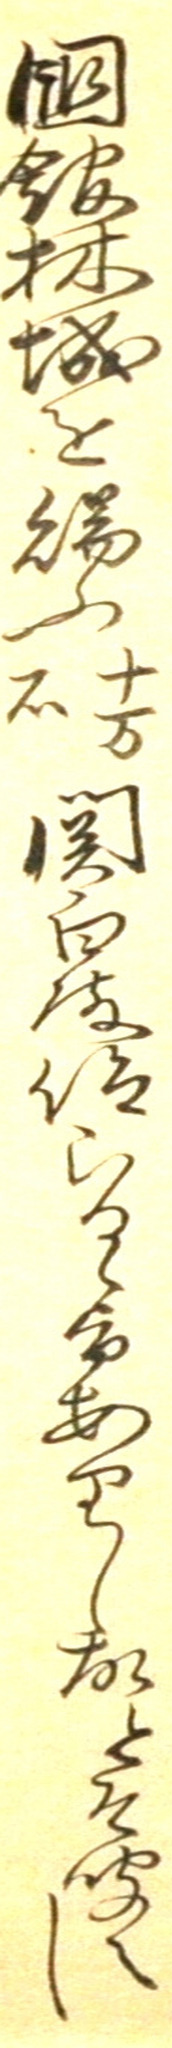国館林城を賜ふ十万石関白殿仰らるゝ旨ありし故とそ聞えし
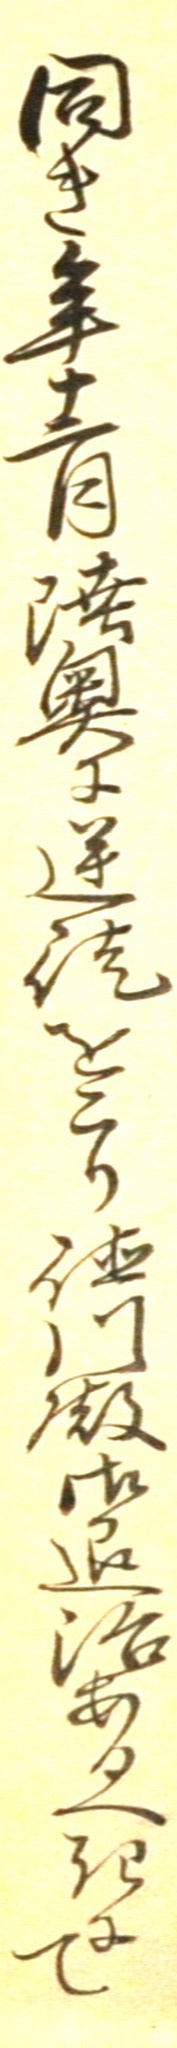同き年十二月陸奥に逆徒をこり徳川殿御退治あるへきにて
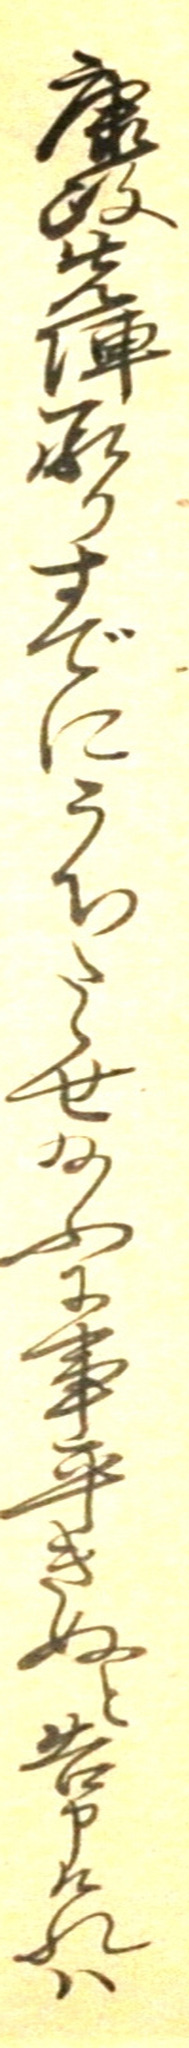康政先陣承りすでにうちたゝせ給ふに事平きぬと告申けれは
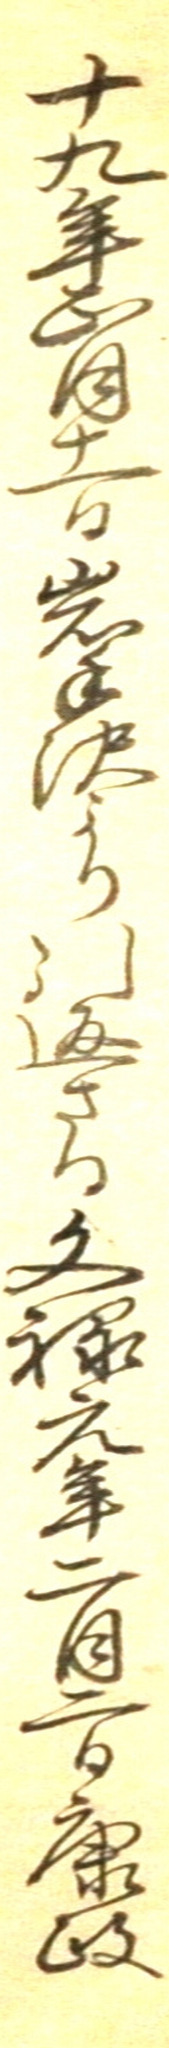十九年正月十一日岩手沢より引返さる文禄元年二月二日康政
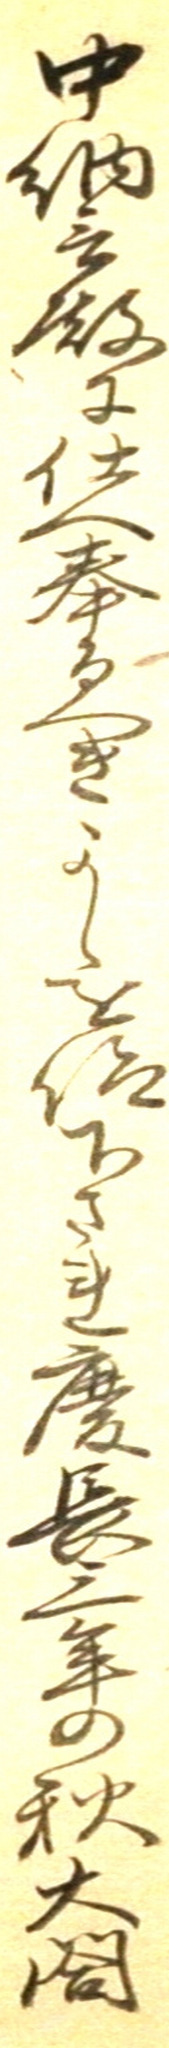中納言殿に仕へ奉るへきよしを仰下され慶長三年の秋太閤
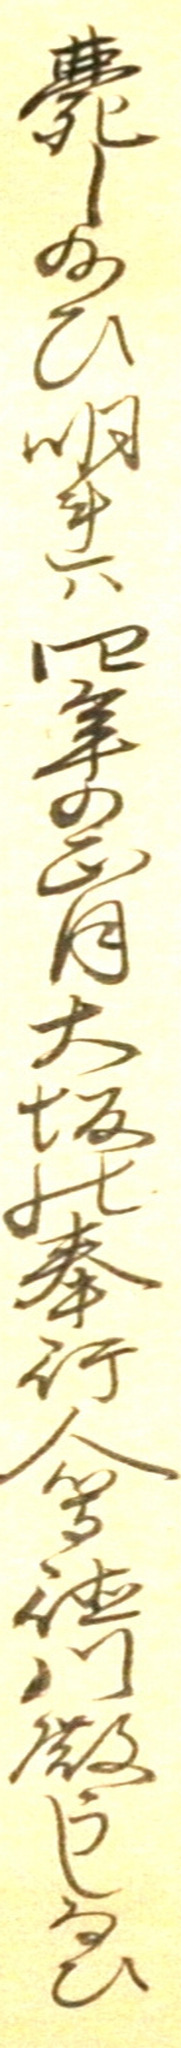薨し給ひ明れは四年の正月大坂の奉行人等徳川殿うしなひ
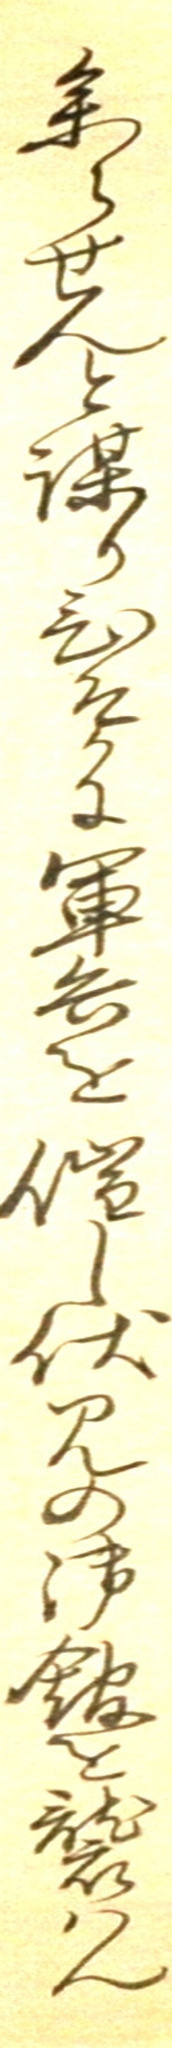参らせんと謀りひそかに軍兵を催し伏見の御館を襲はん
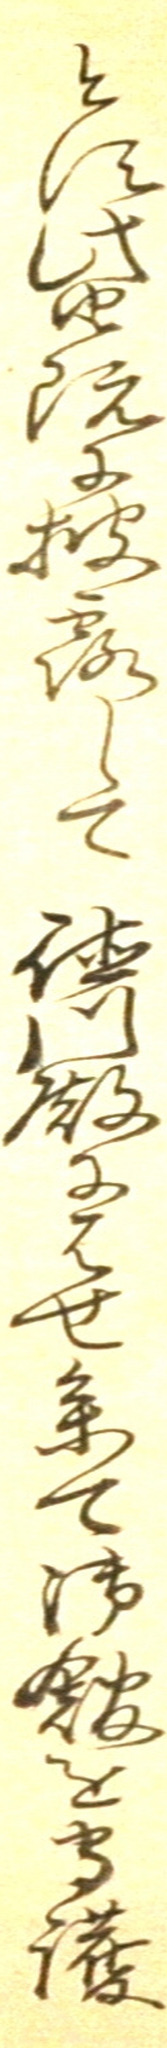とす此由既に披露して徳川殿にはせ参て御館を守護
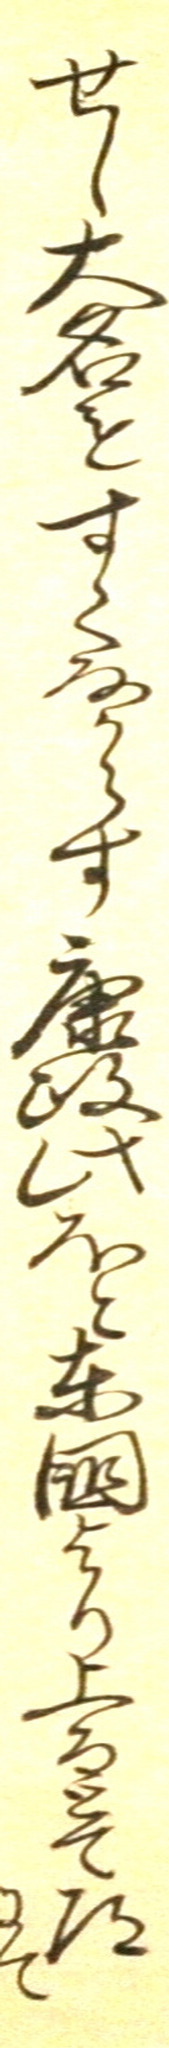せし大名もすくなからす康政此ほと東国より上るとて道にて
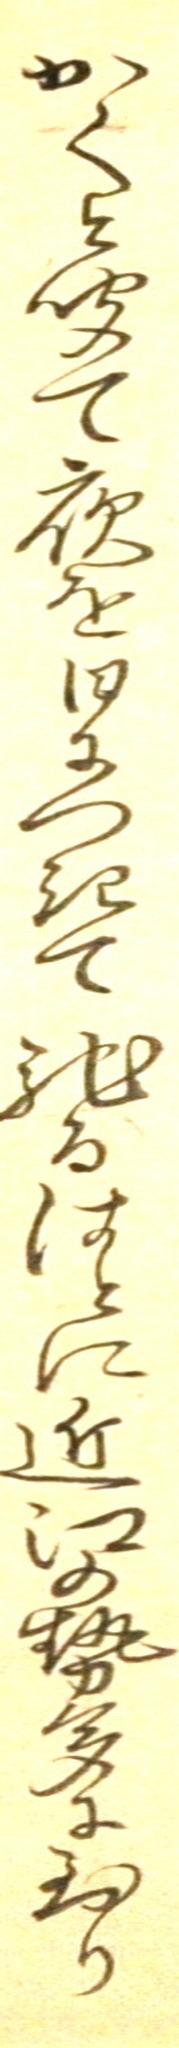かくと聞て夜を日につきて馳るはとに近江の勢多に至り
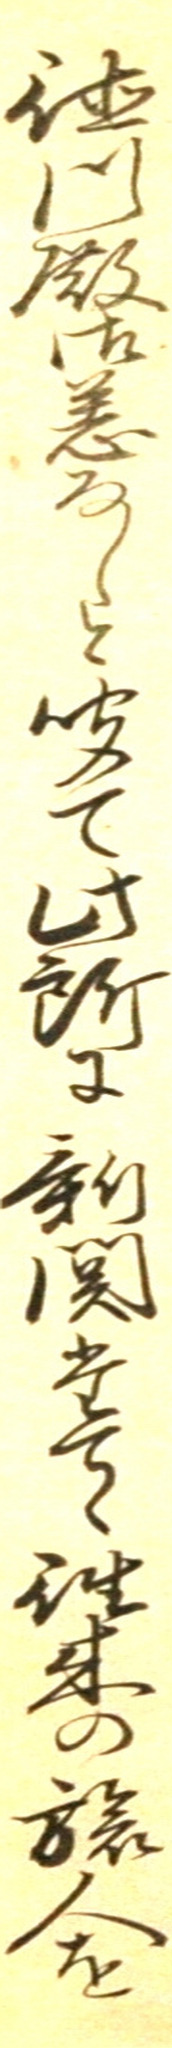徳川殿御恙なしと聞て此所に新関たてゝ往来の旅人を
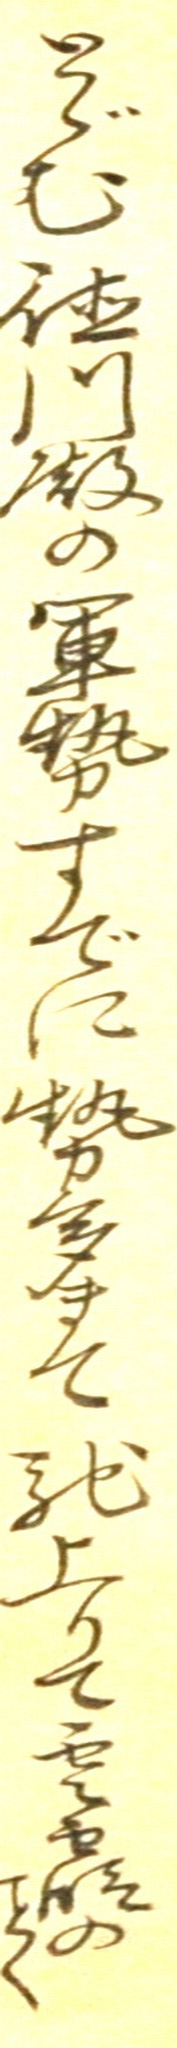とゞむ徳川殿の軍勢すでに勢多まて馳上りて雲霞のことく

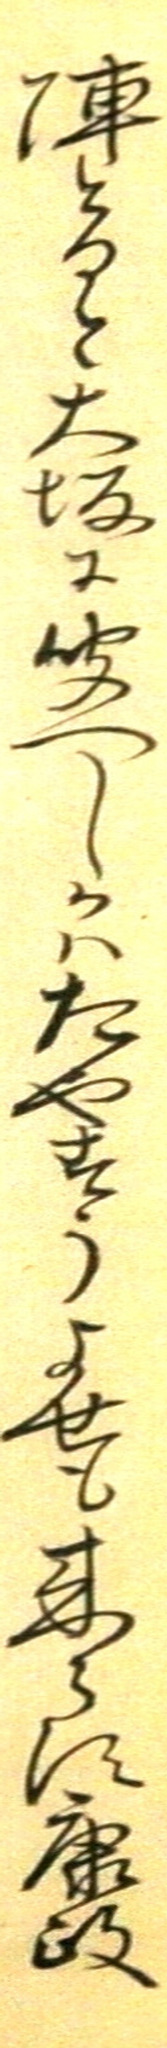陣とると大坂に聞へしかはたやすうよせも来らす康政
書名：藩翰譜（四・上）
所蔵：伊那市立高遠町図書館・合同会社AMANE
